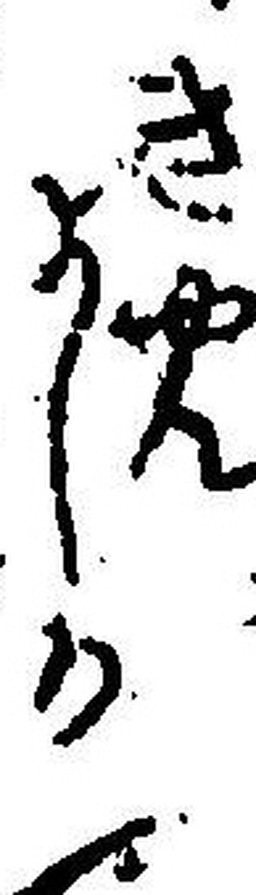よしか

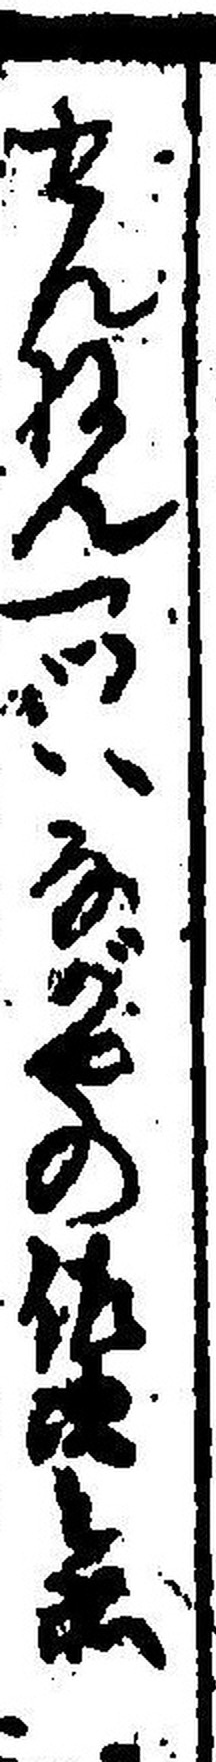せんねん一つながやの佐次兵衛
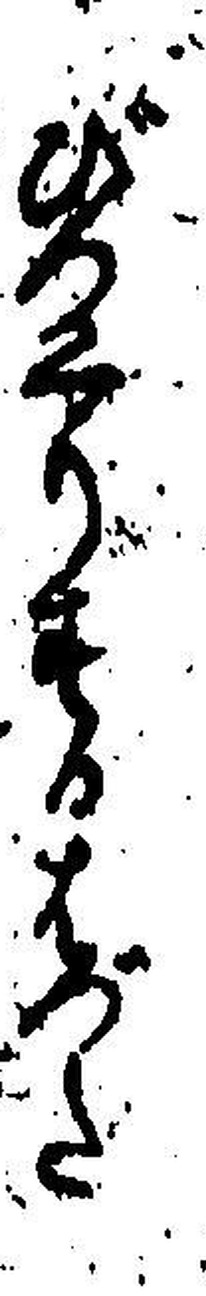びつくりするはづた
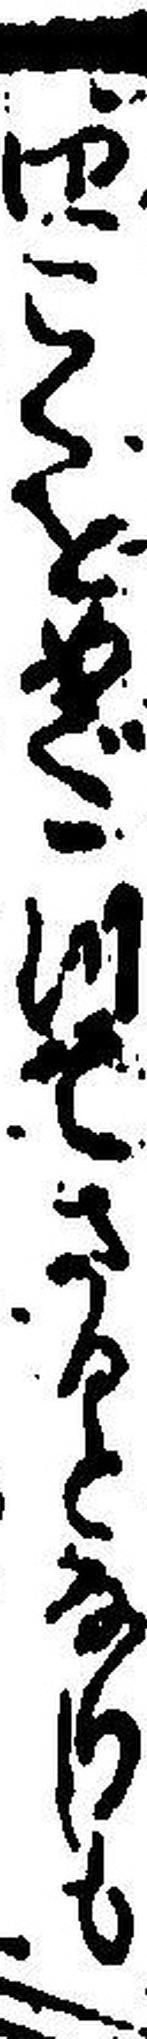四こくをめぐつてさるとなりしも
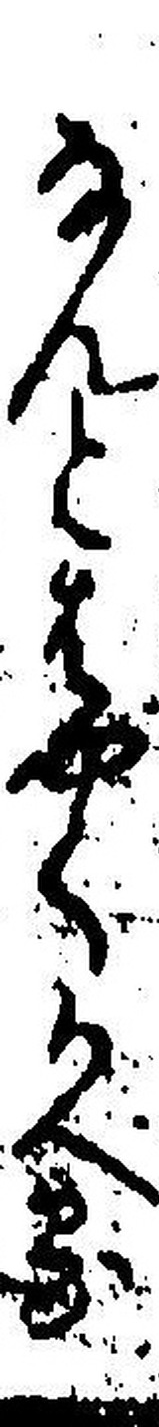なんとはやくかへる
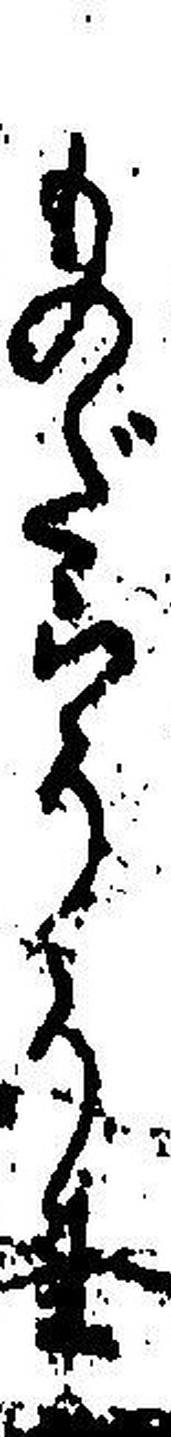ものだらううれ
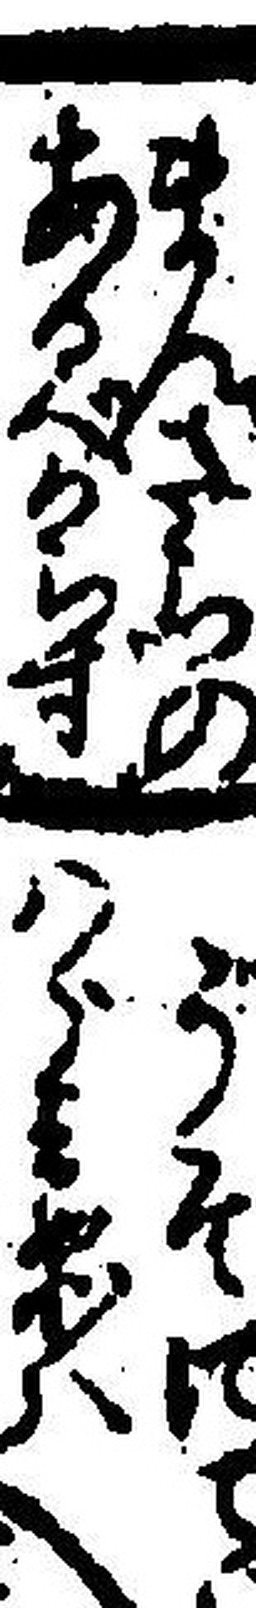あるべからす八郎兵衛は
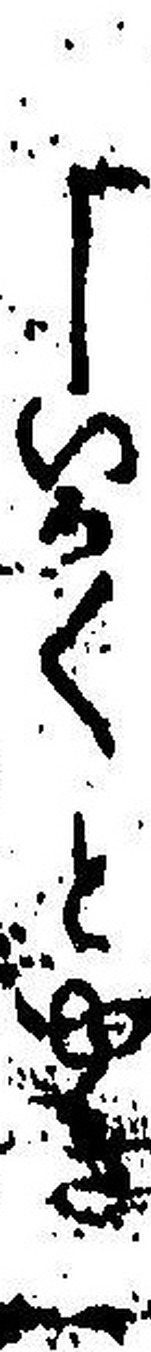しいか〳〵とやき
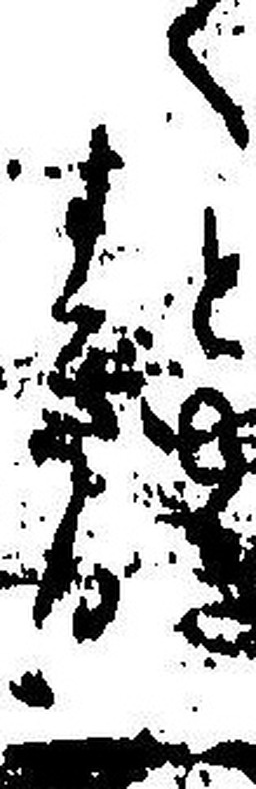すぎる
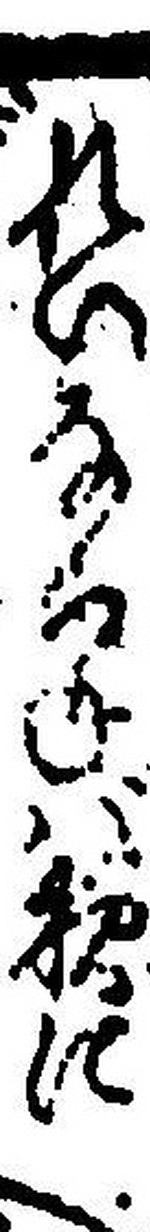れいならねば夜に
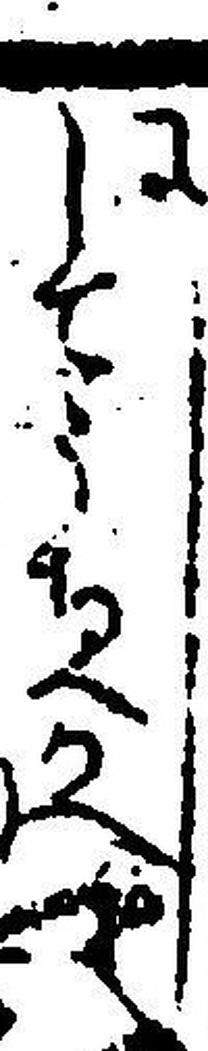してうちへかへ
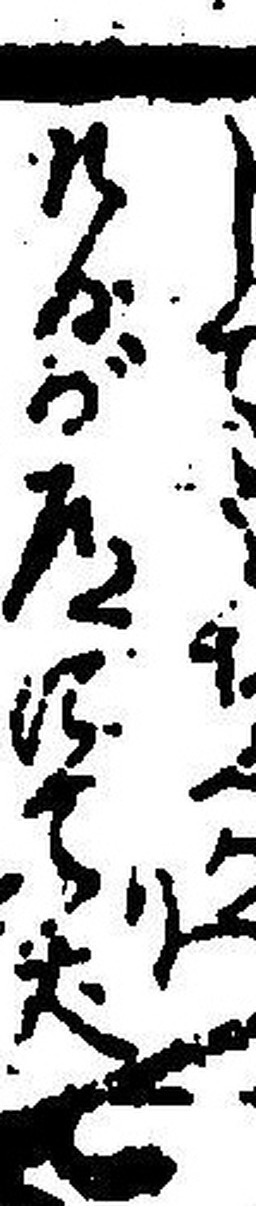けるが道にて犬
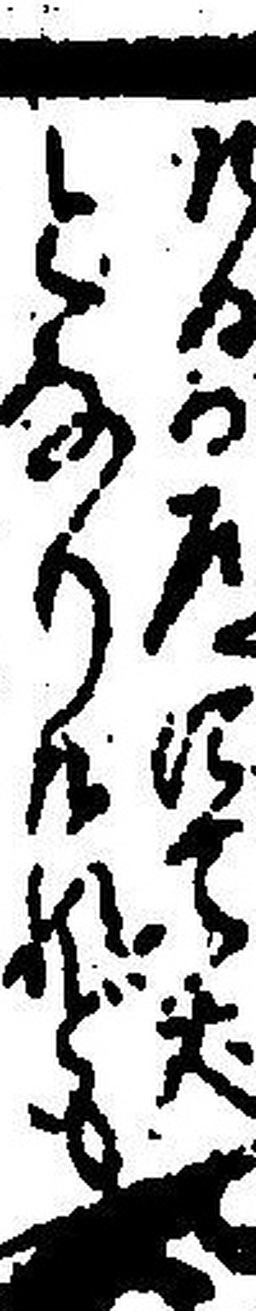となりけれども
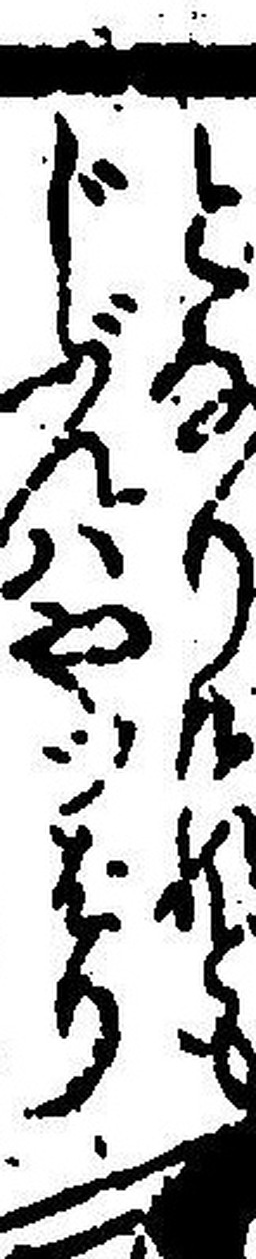じぶんはやつはり
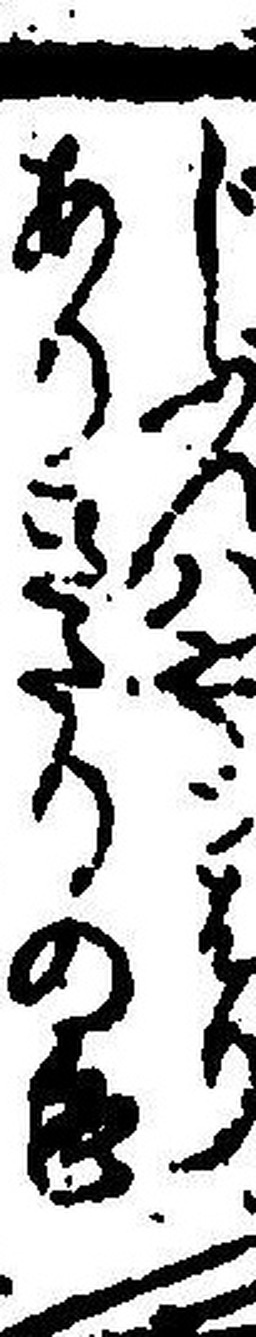ありきたりの色
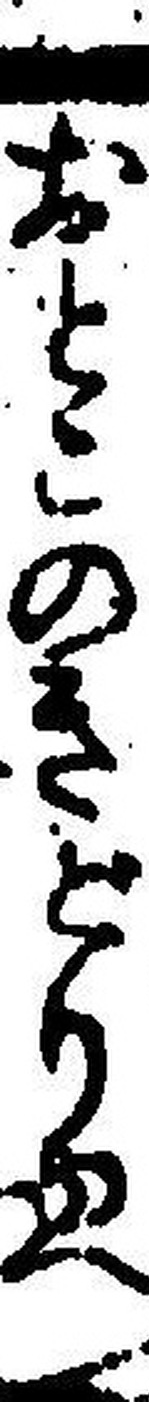おとこのきどりゆへ
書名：花芳野犬斑 / 山東京伝作
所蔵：東京大学総合図書館 General Library in the University of Tokyo, JAPAN
